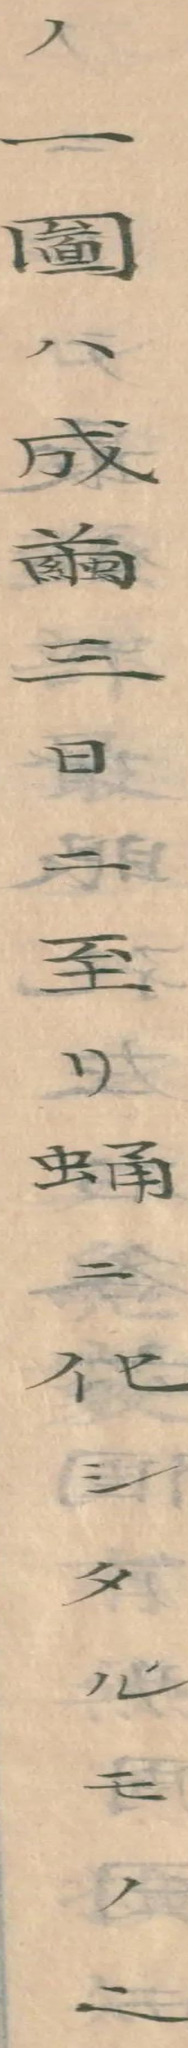ノ一図ハ成繭三日ニ至リ蛹ニ化シタルモノ也
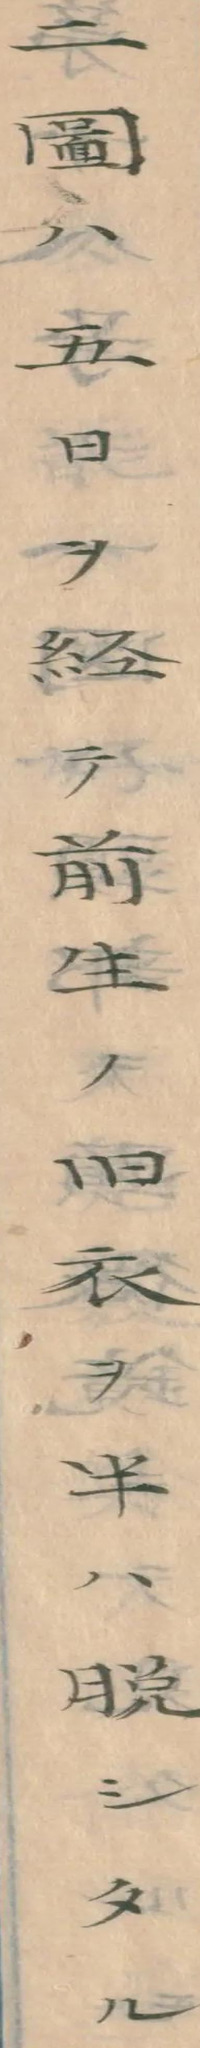二図ハ五日ヲ経テ前生ノ旧衣ヲ半ハ脱シタル
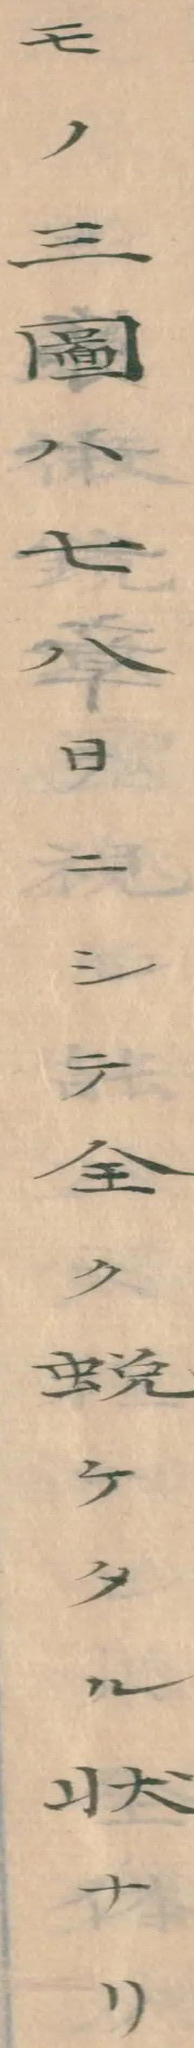モノ三図ハ七八日ニシテ全ク蛻ケタル状ナリ
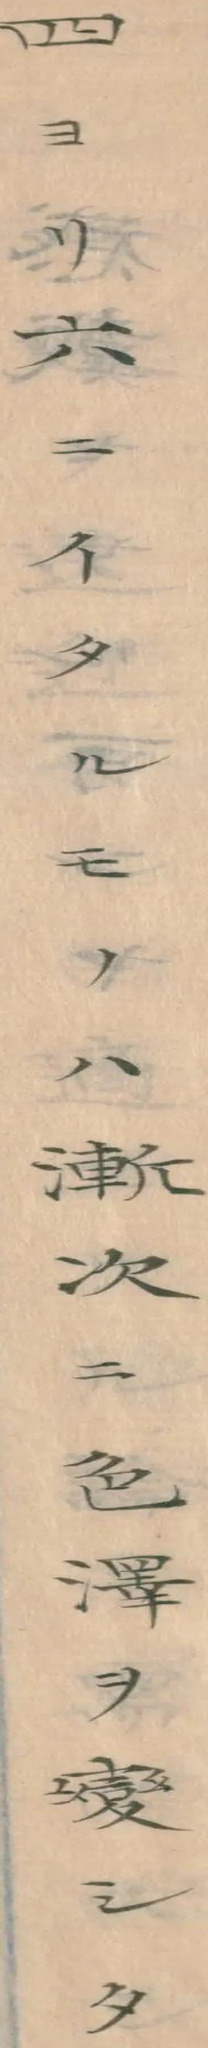四ヨリ六ニイタルモノハ漸次ニ色沢ヲ変シタ
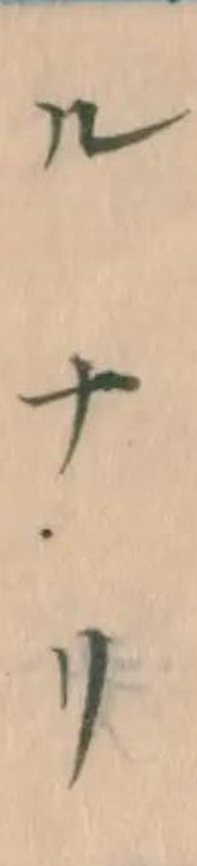ルナリ
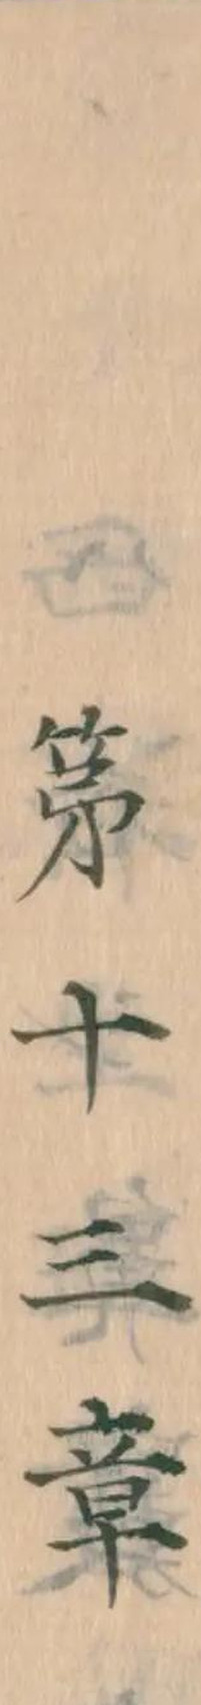第十三章
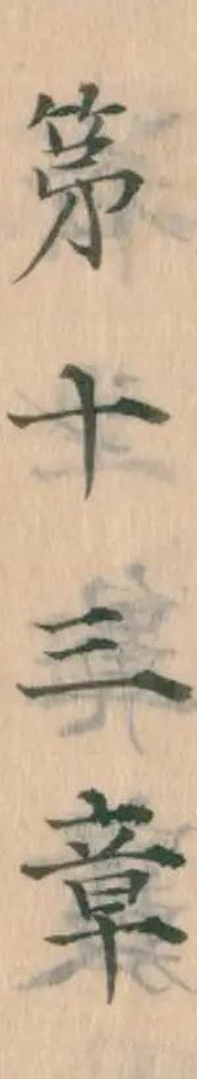第十三章
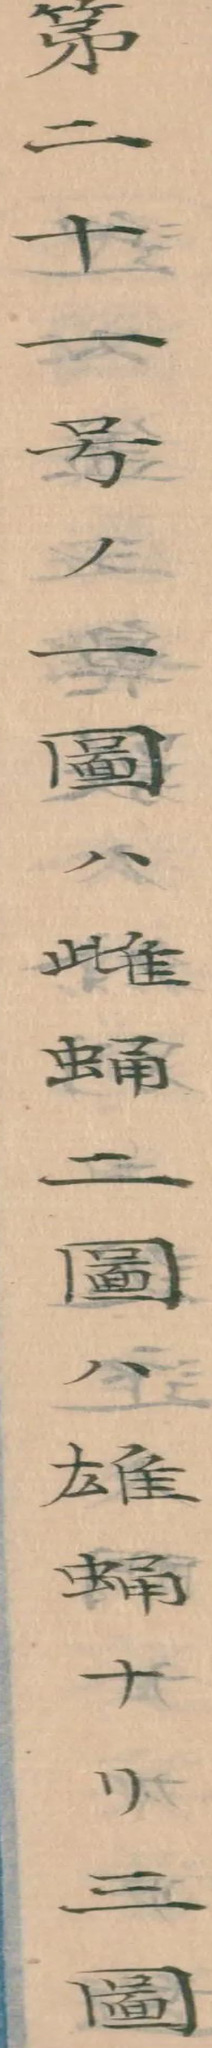第二十一号ノ一図ハ雌蛹二図ハ雄蛹ナリ三図
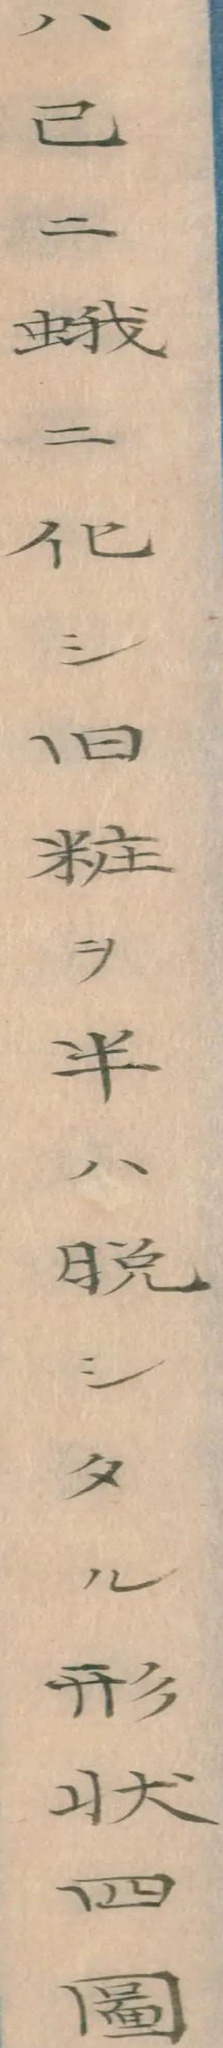ハ已ニ蛾ニ化シ旧粧ヲ半ハ脱シタル形状四図
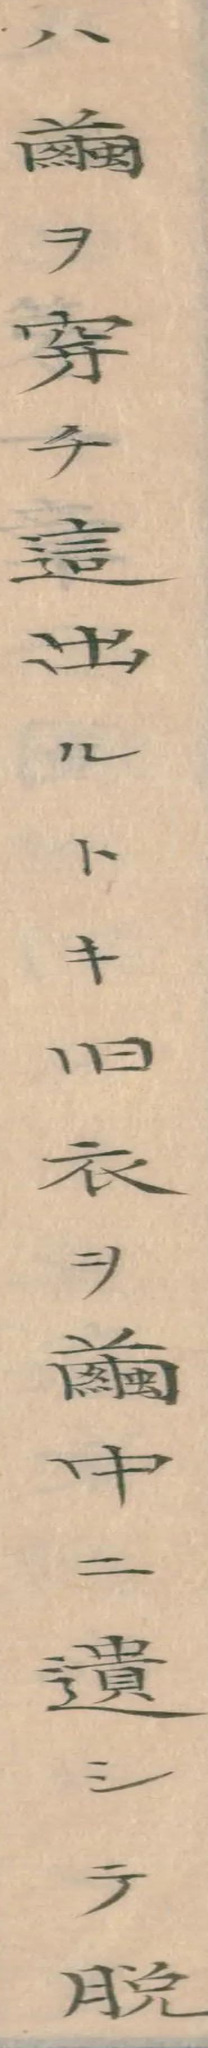ハ繭ヲ穿チ這出ルトキ旧衣ヲ繭中ニ遺シテ脱
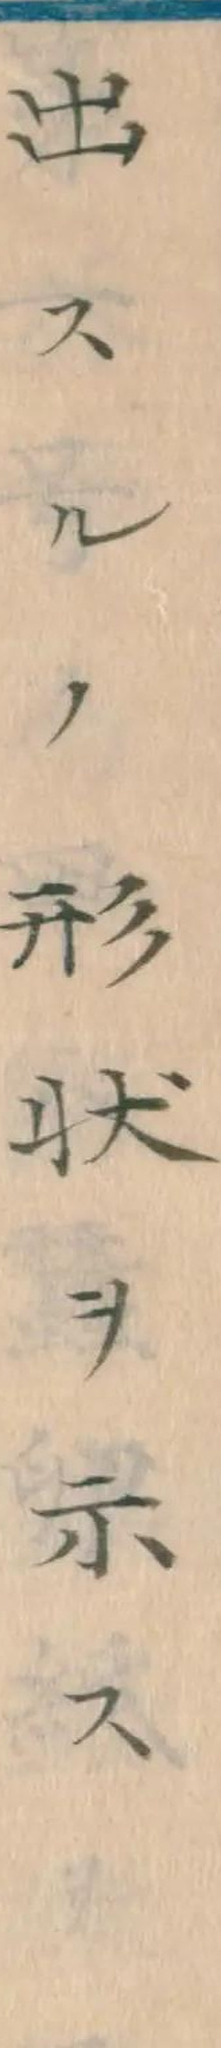出スルノ形状ヲ示ス
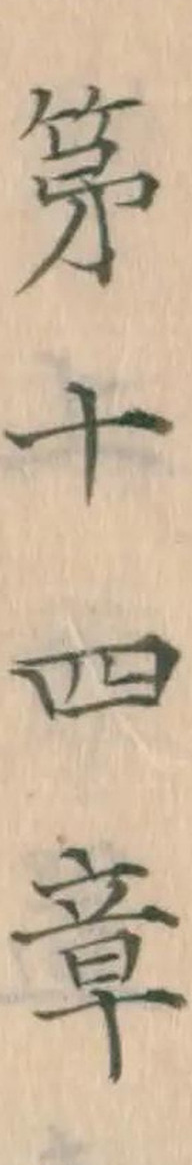第十四章
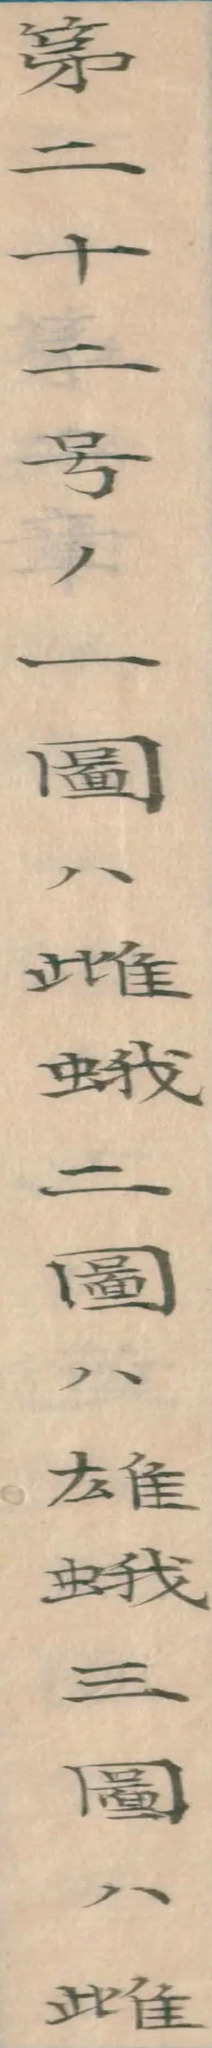第二十二号ノ一図ハ雌蛾二図ハ雄蛾三図ハ雌
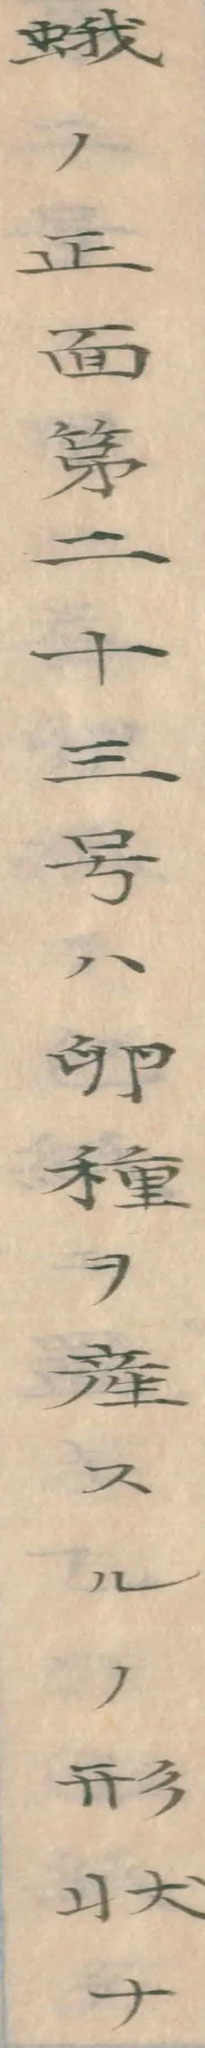蛾ノ正面第二十三号ハ卵種ヲ産スルノ形状ナ
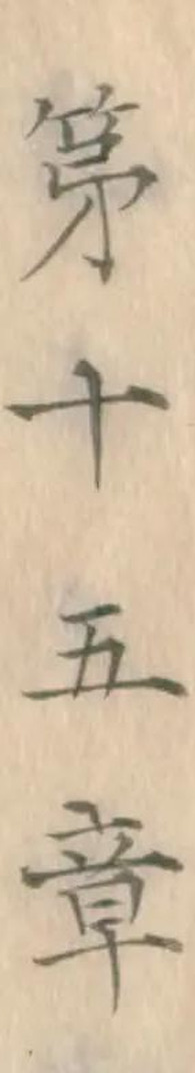第十五章
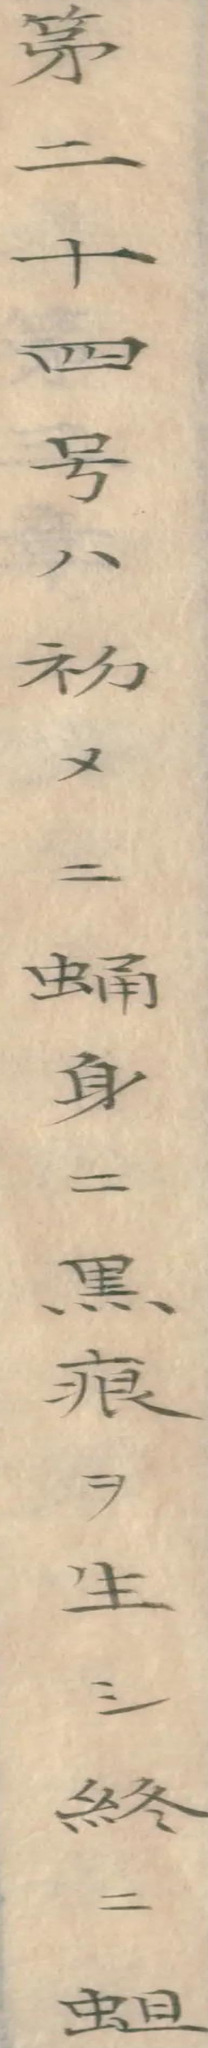第二十四号ハ初メニ蛹身ニ黒痕ヲ生シ終ニ蛆
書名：蚕桑集成
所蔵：国立国会図書館 National Diet Library, JAPAN
